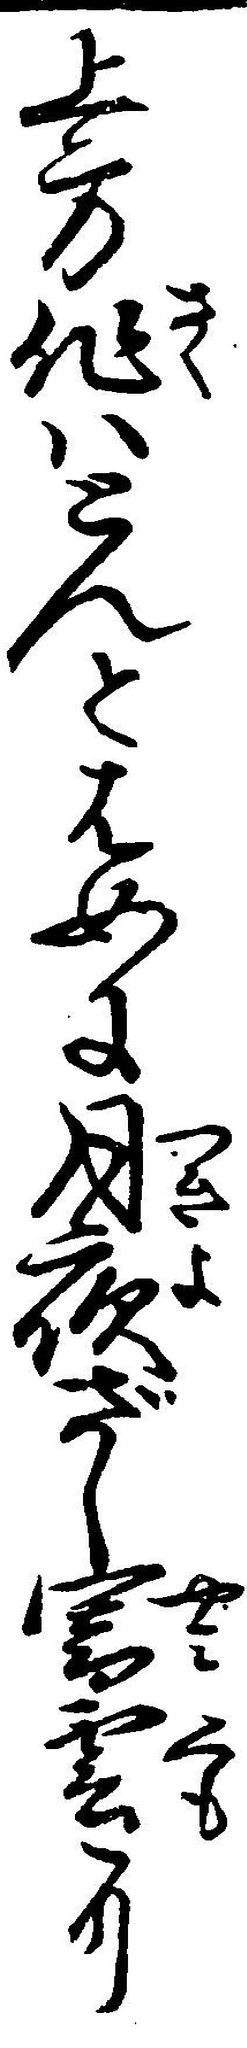上方作はとんとはめに月夜ざし闇雲に
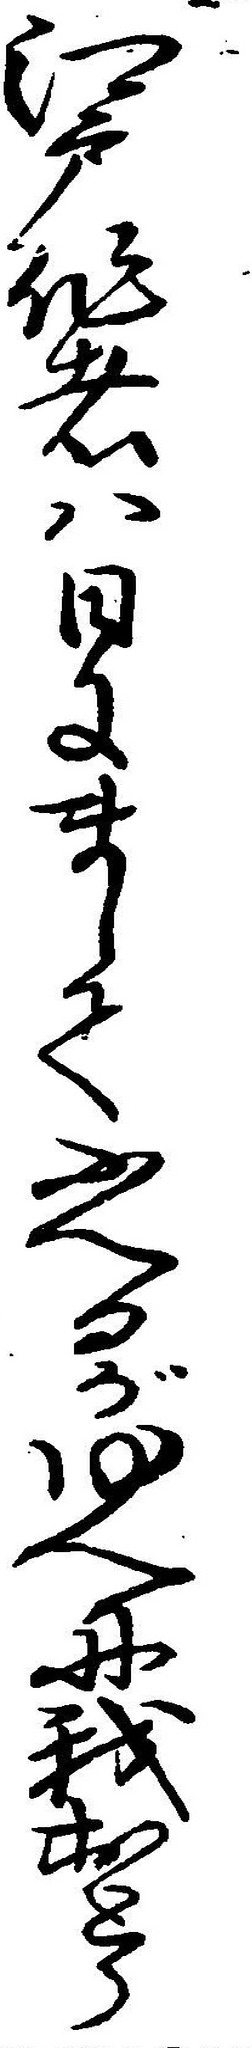江戸作者は日にましてふへるがゆへに我おとら
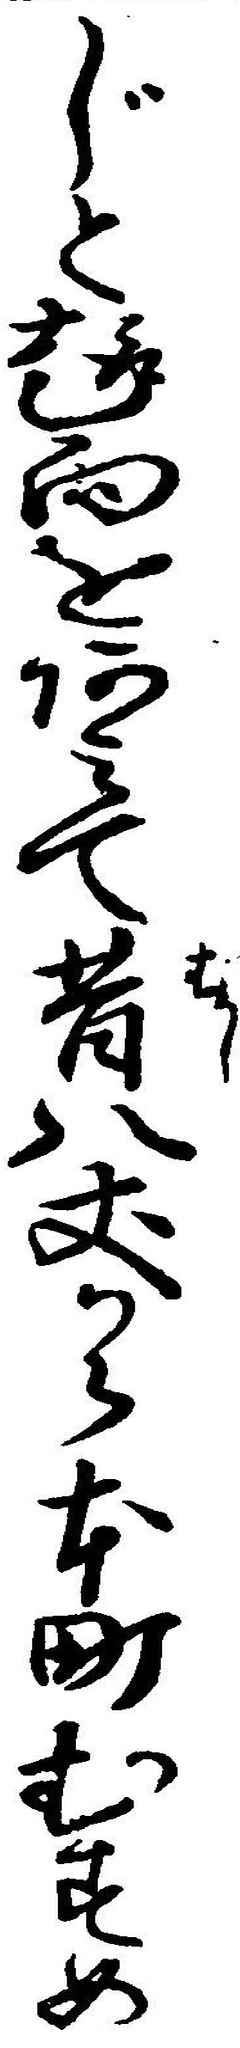じと趣向をあみて昔八丈から本町むすめ
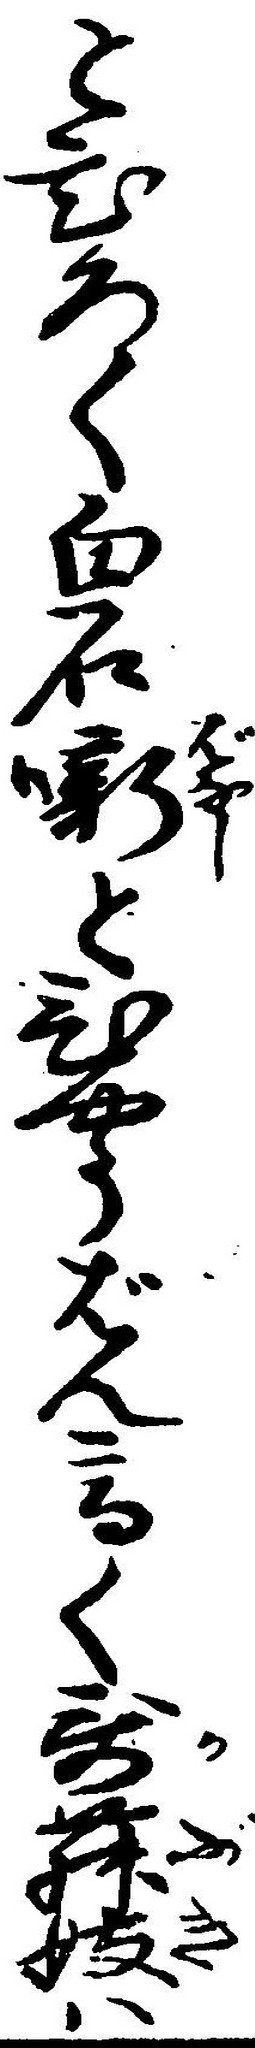とひろく白石噺とひやうばん高く歌舞妓は
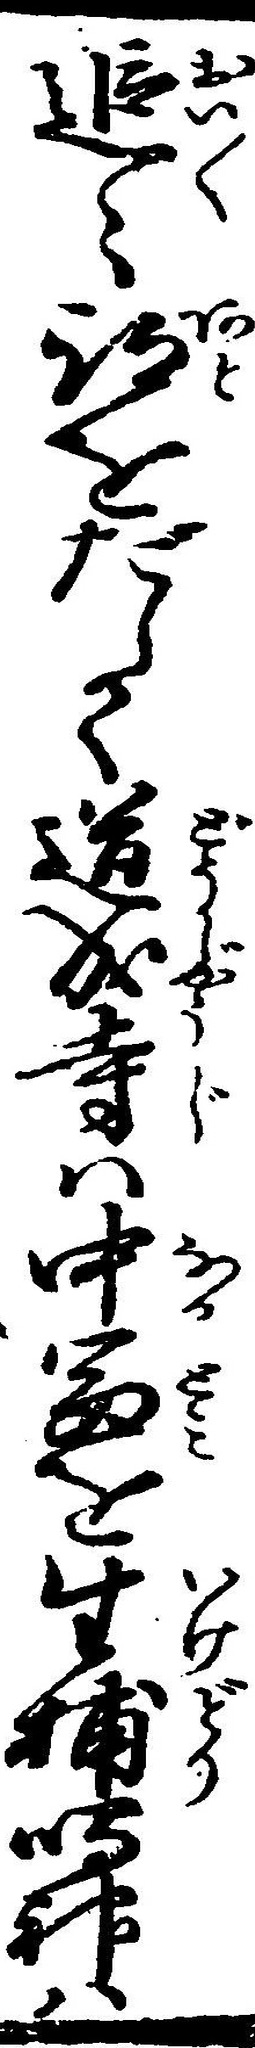追々跡をだして道成寺は中富を生捕鳴神は
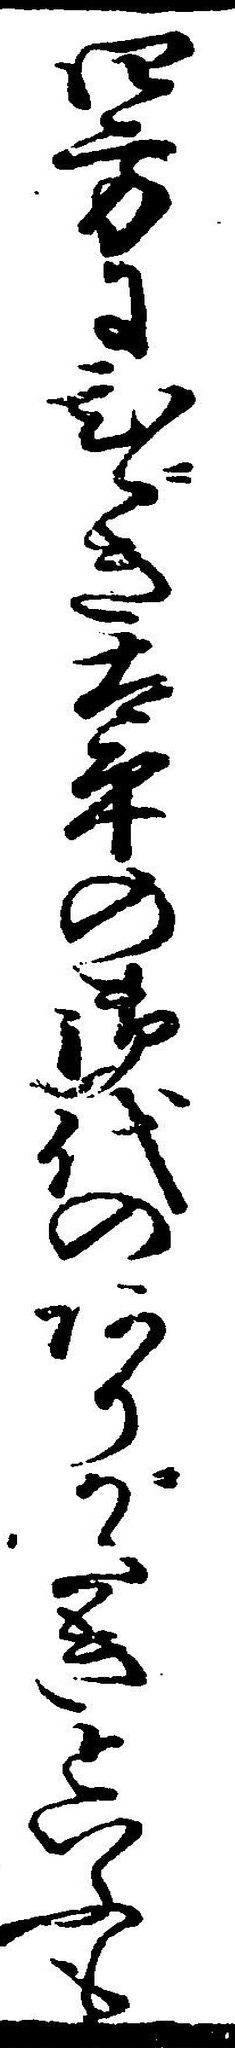四方にひゞき太平の御代のありがたきといふも
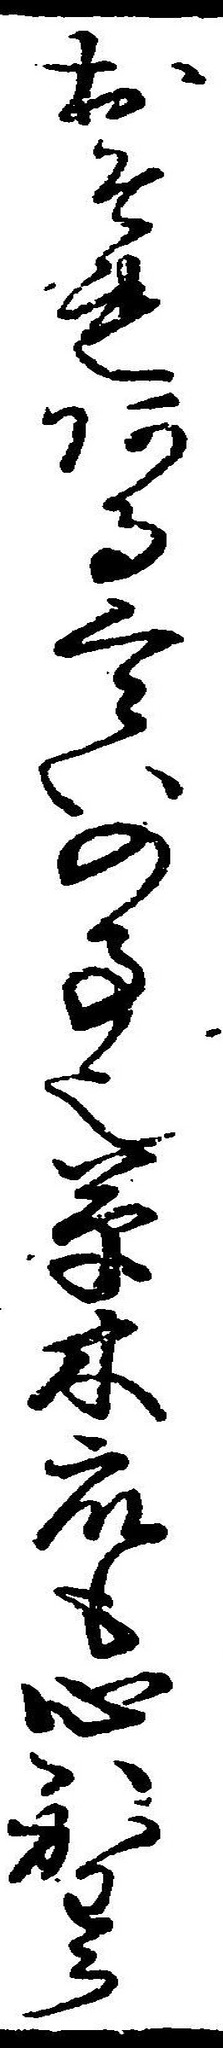おそれあるくらいの事也草木衆もこゝろはかわら
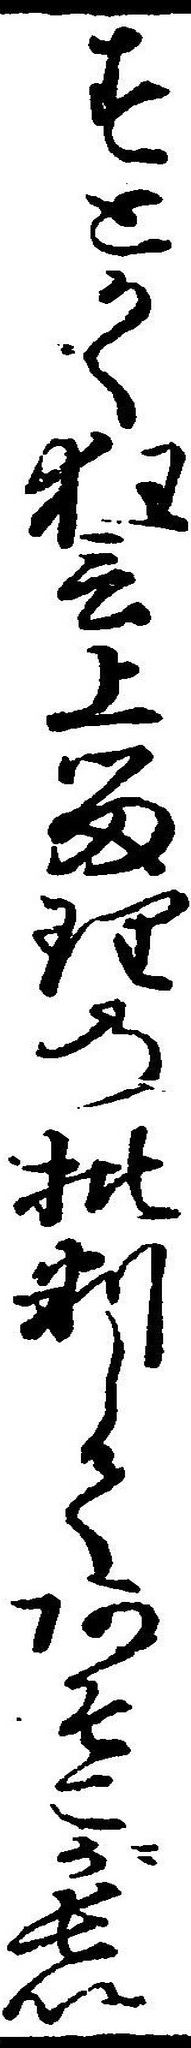すとかく狂言上留理の批判してあそこが長い
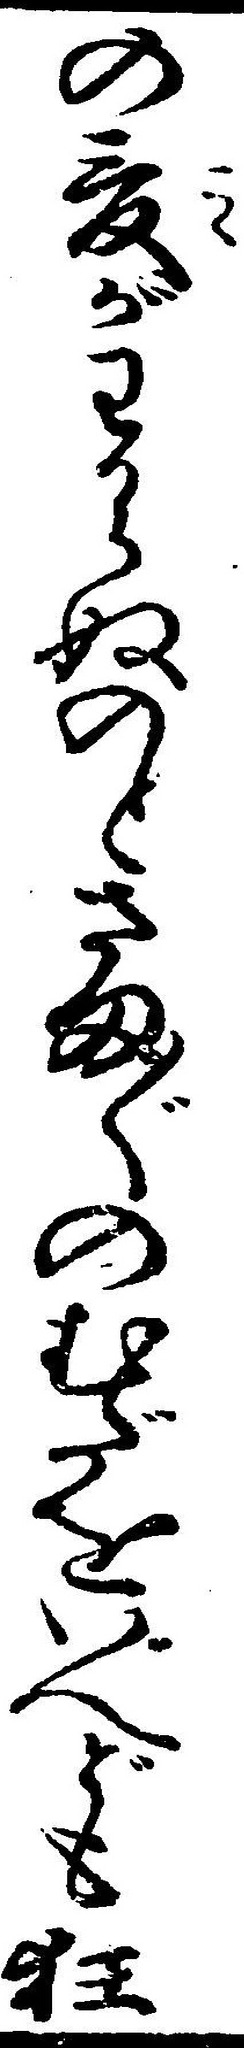の爰がわからぬのとさま〴〵のむだをいへども狂
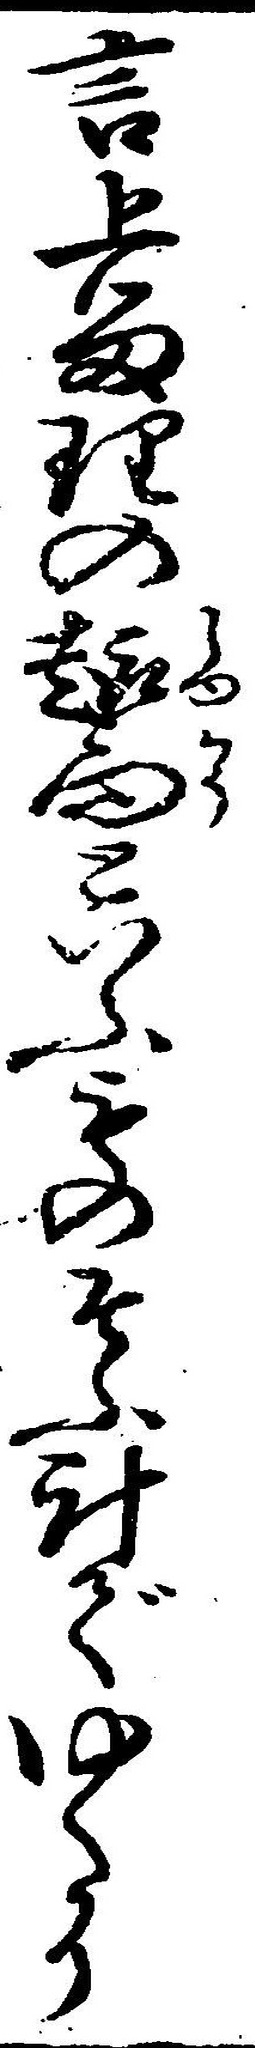言上留理の趣向といふものそふ計でゆくに
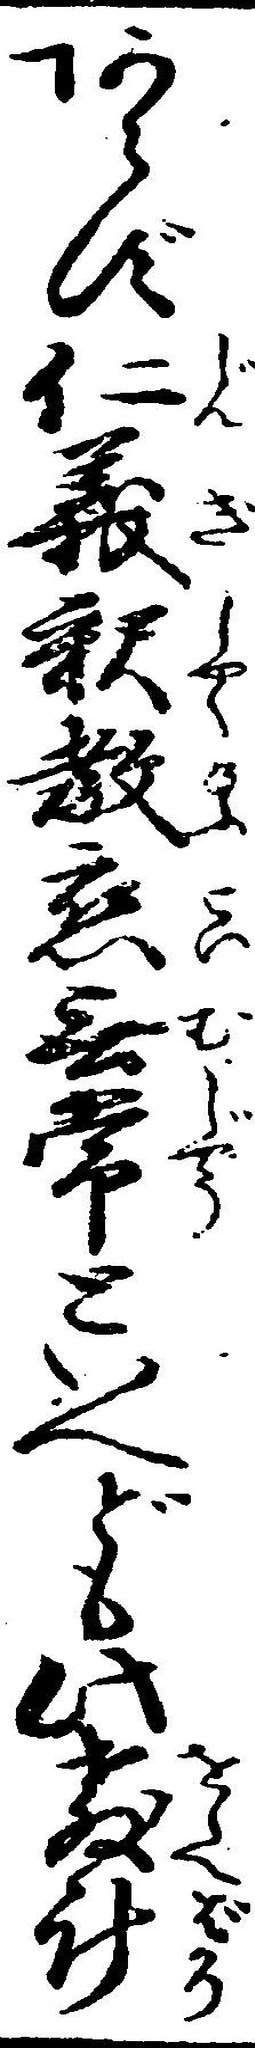あらず仁義釈教恋無常といへども此教計

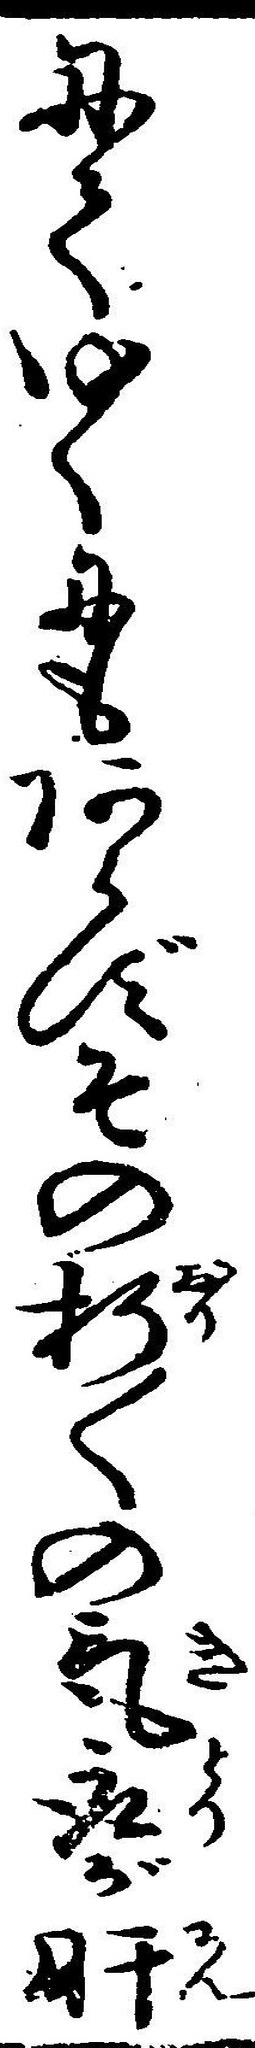にてゆくにもあらずその折〳〵の気取が肝
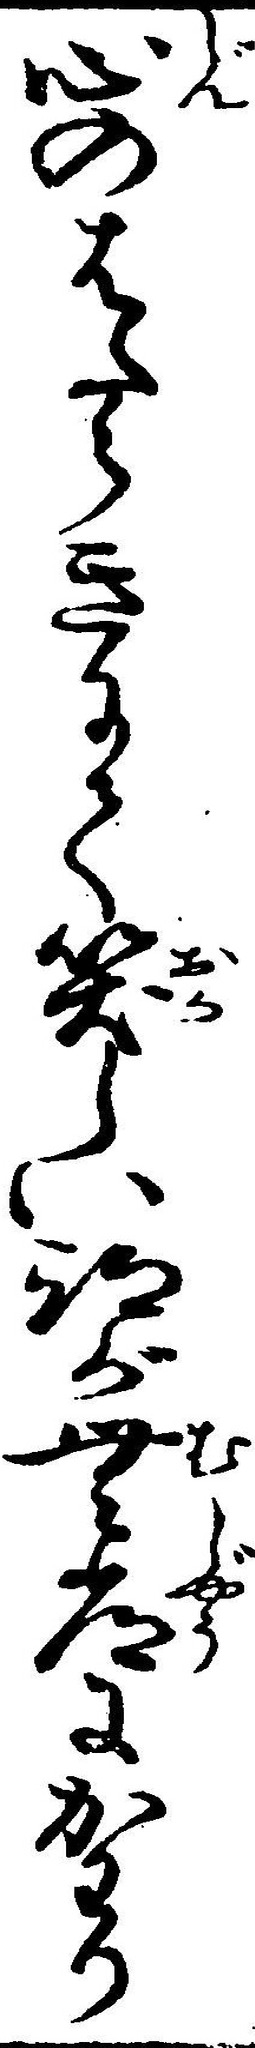心のはたらきにて笑しい跡が無常にかわり
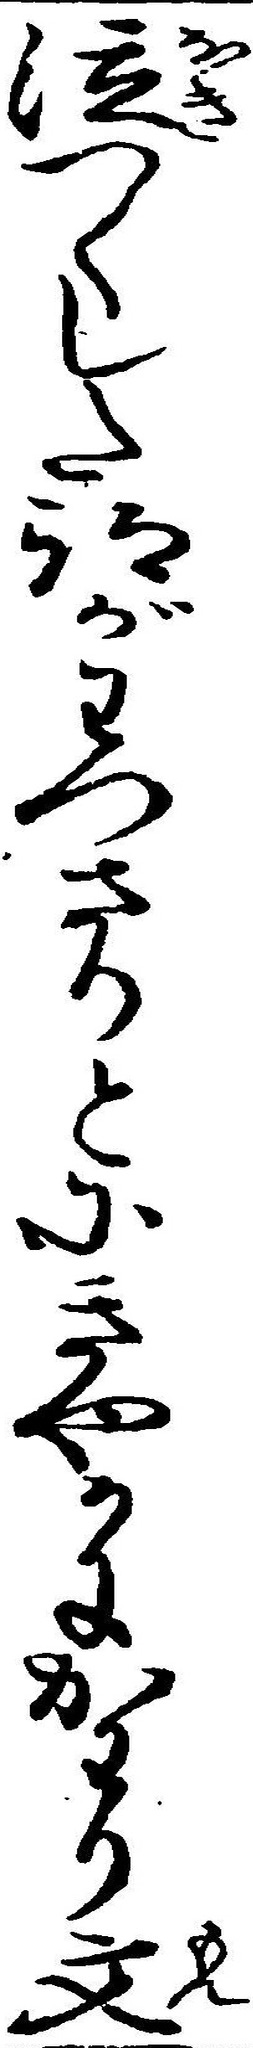泣つくした跡がわつさりとにきやかにかわり文
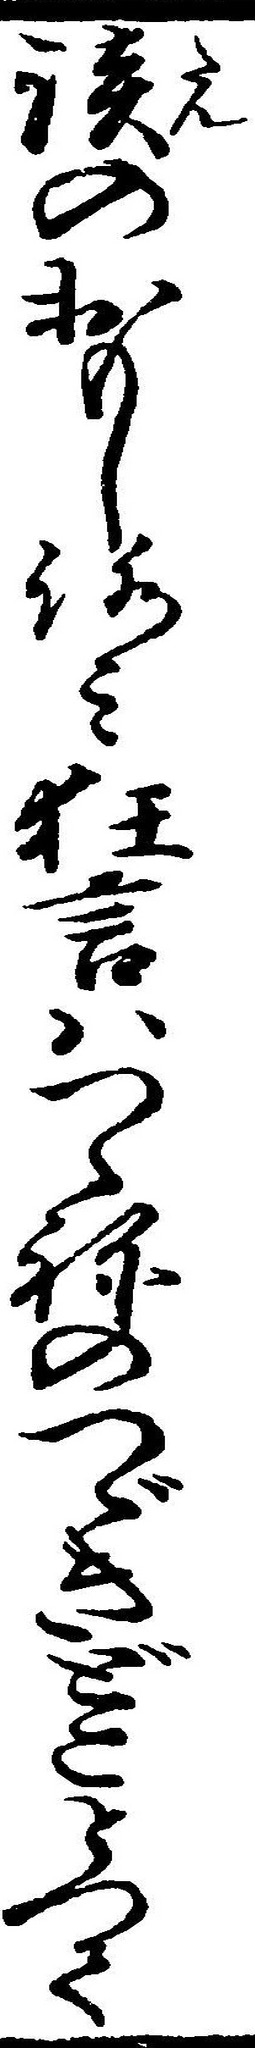談のおもしろみ狂言はつゝねのつゞきどことつて
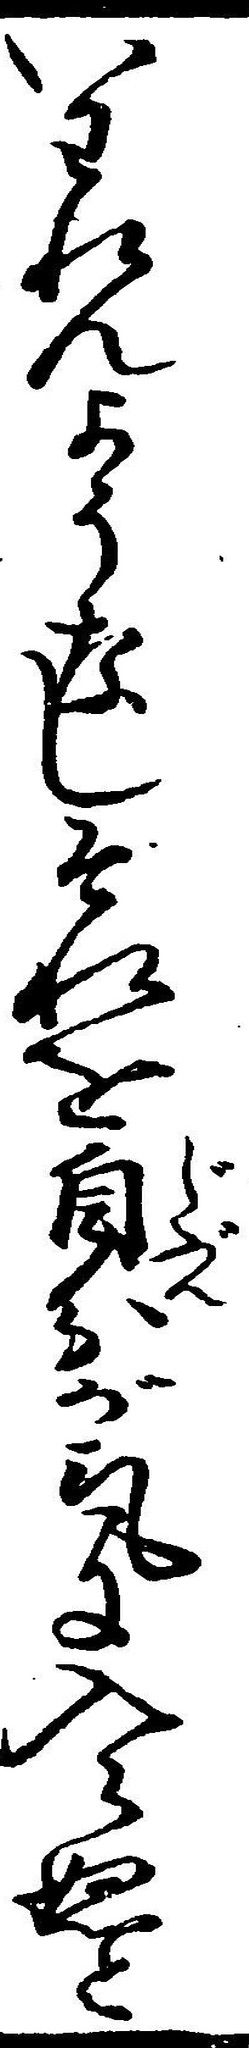いわれんようなしそれを自分が気に入らぬと
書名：草木芝居化物退治 / 泉花堂三蝶(十六兵衛)作
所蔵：東京大学総合図書館 General Library in the University of Tokyo, JAPAN
